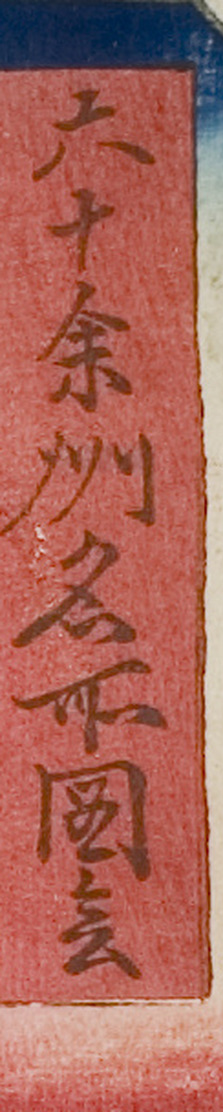六十余州名所図会
